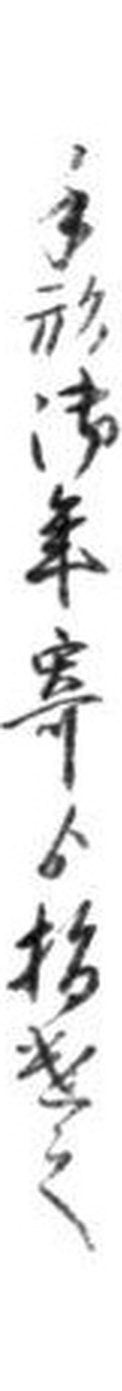手形御年寄ゟ指遣之
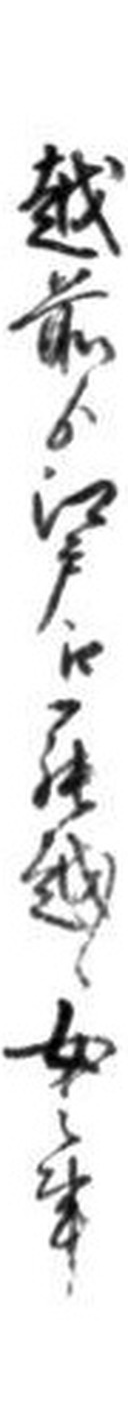越前ゟ江戸江罷越候女之事
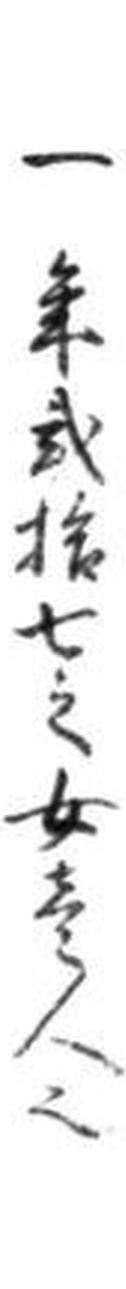一年弐拾七之女壱人也
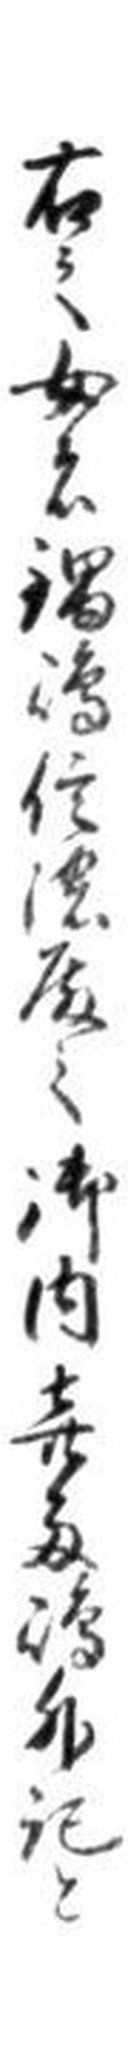右之女は鍋島信濃殿之御内喜多島外記と
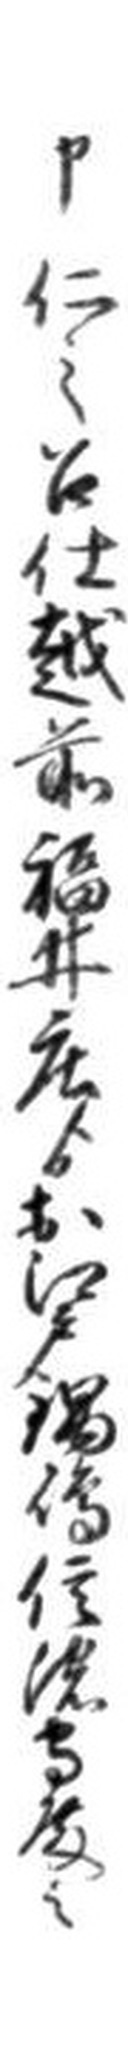申仁之召仕越前福井庄ゟ於江戸鍋島信濃守殿之
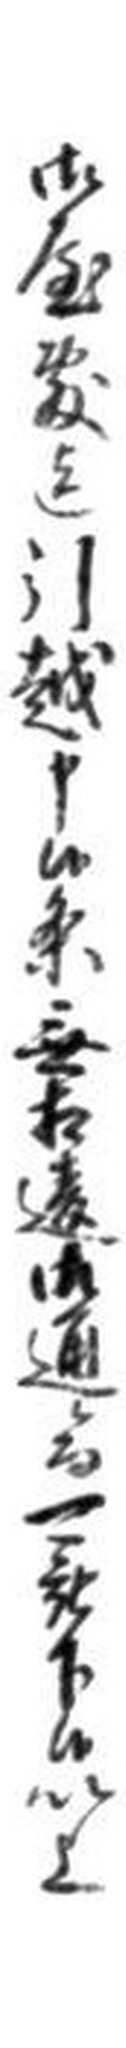御屋敷迄引越申候条無相違御通候而可被下候以上
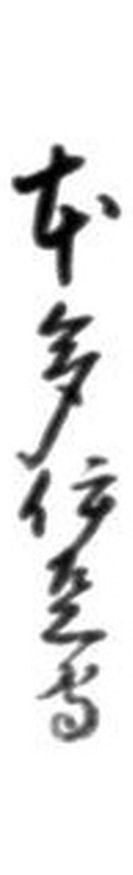本多伊豆守
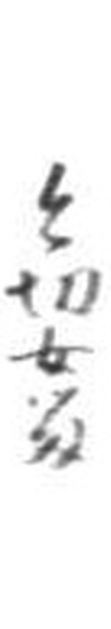今切女留
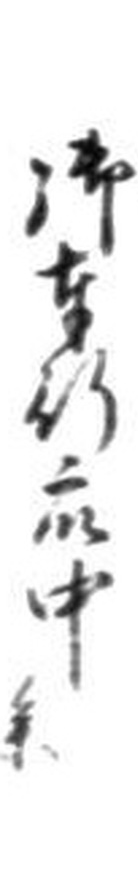御奉行衆中参
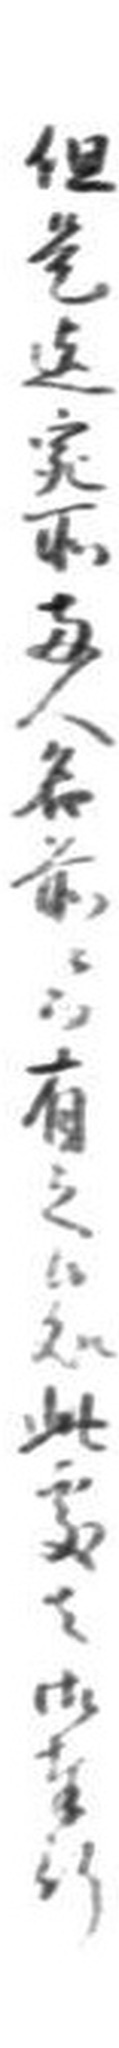但是迄宛所両人名前ニ而有之候処此処は御奉行
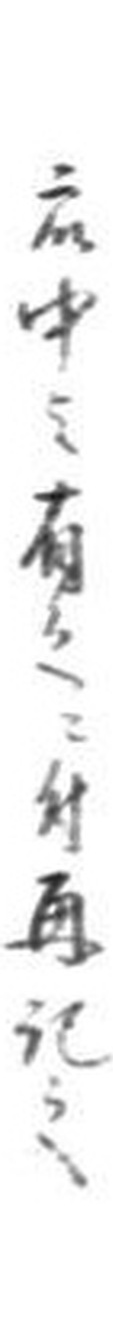衆中与有之ニ付再記之
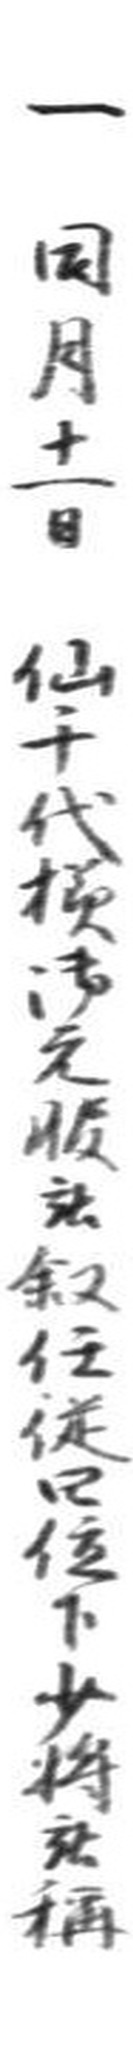一同月十一日仙千代様御元服被叙任従四位下少将被称
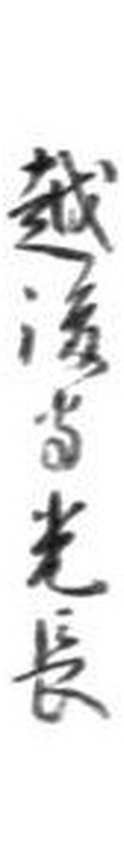越後守光長
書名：家譜 三 忠昌公 従慶長八年到寛永六年
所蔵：福井県文書館 Fukui Prefectural Archives
